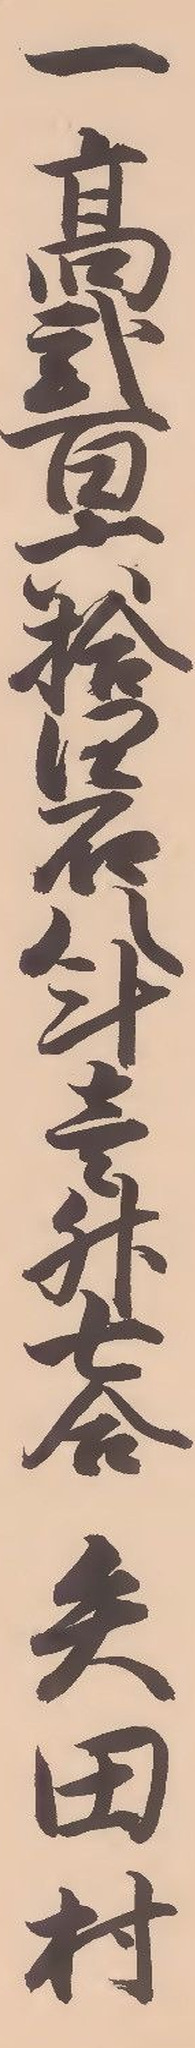一高弐百六拾四石八斗壱升七合矢田村
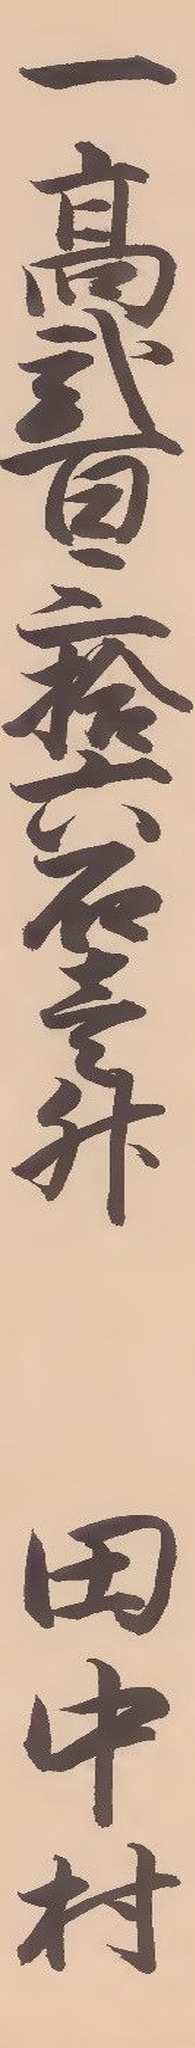一高弐百三拾六石壱升田中村

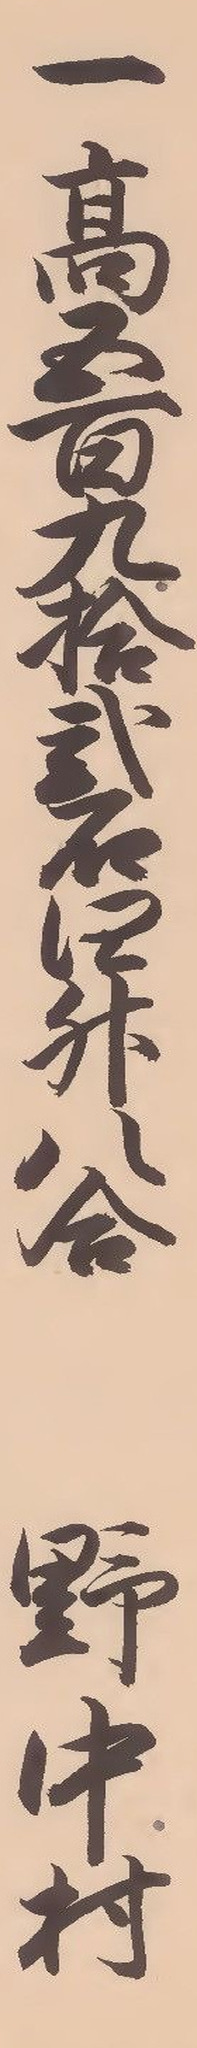一高五百九拾弐石四升八合野中村
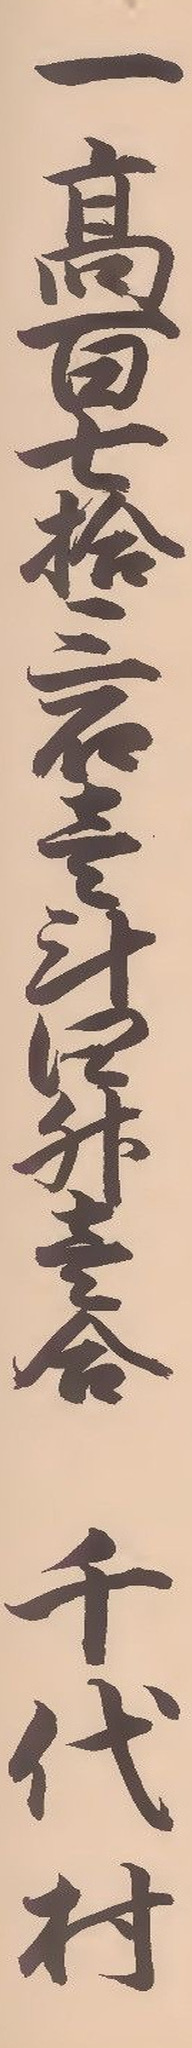一高百七拾三石壱斗四升壱合千代村
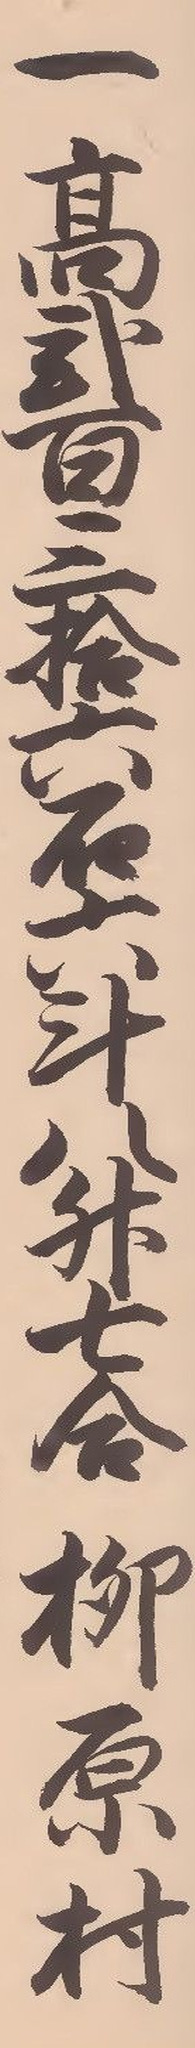一高弐百三拾六石六斗八升七合柳原村

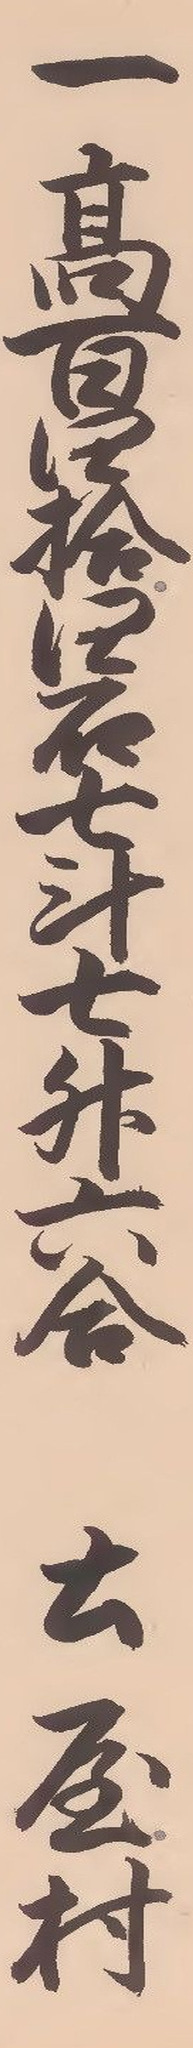一高百四拾四石七斗七升六合土屋村
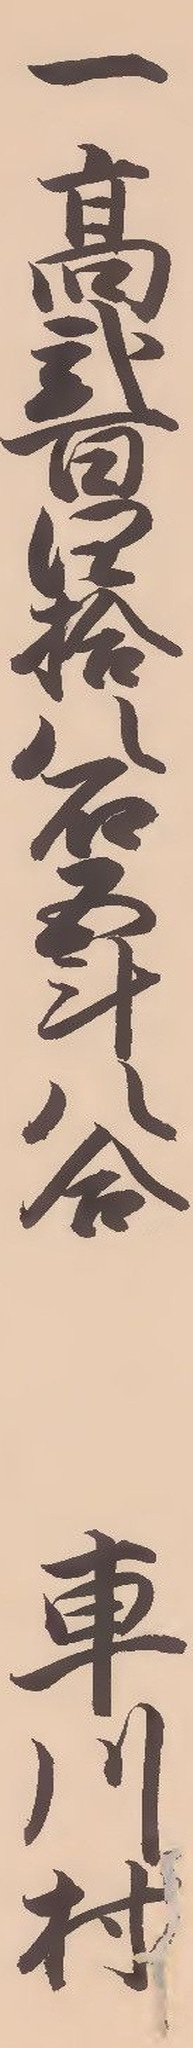一高弐四拾八石五斗八合車川村
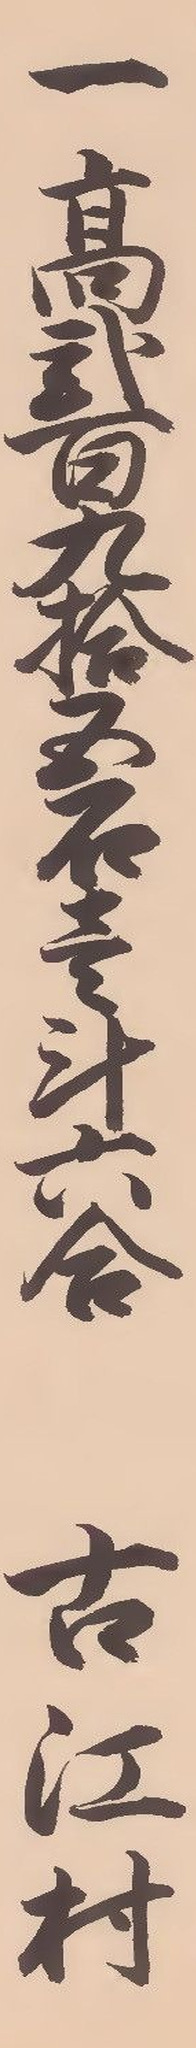一高弐百九拾五石壱斗六合古江村

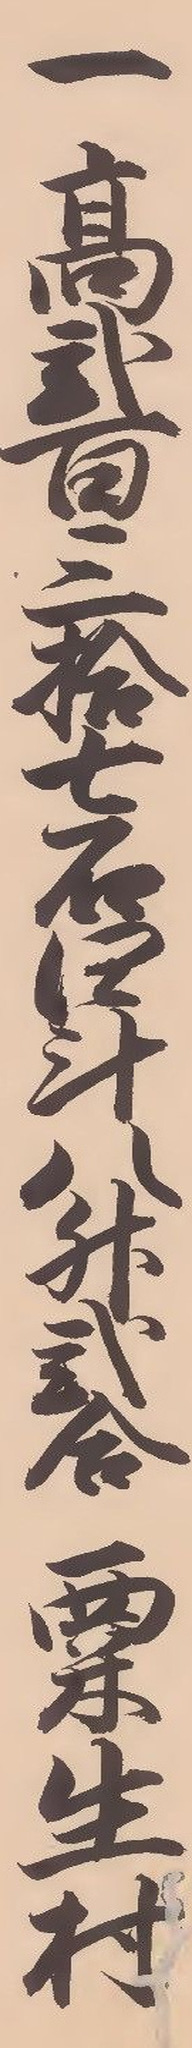一高弐百三拾七石四斗八升弐合粟生村
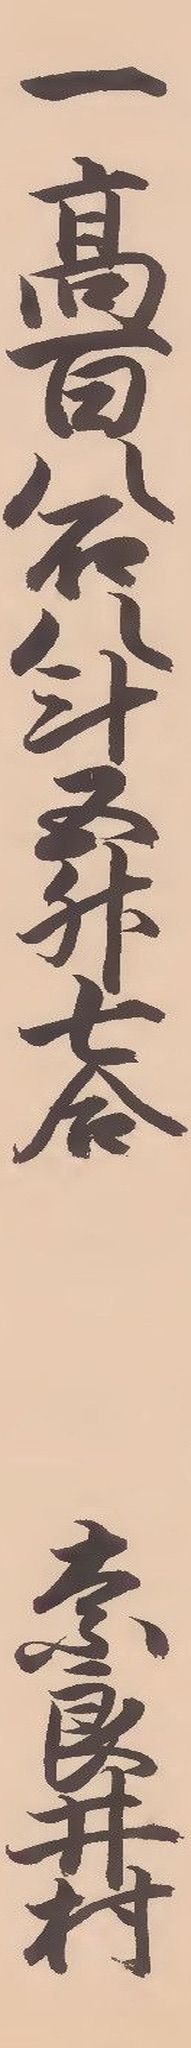一高百八石八斗五升七合奈良井村
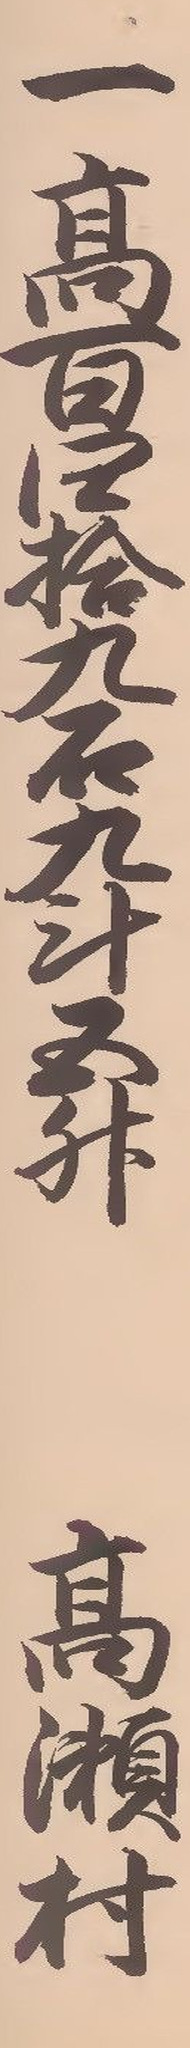一高百四拾九石九斗五升高瀬村
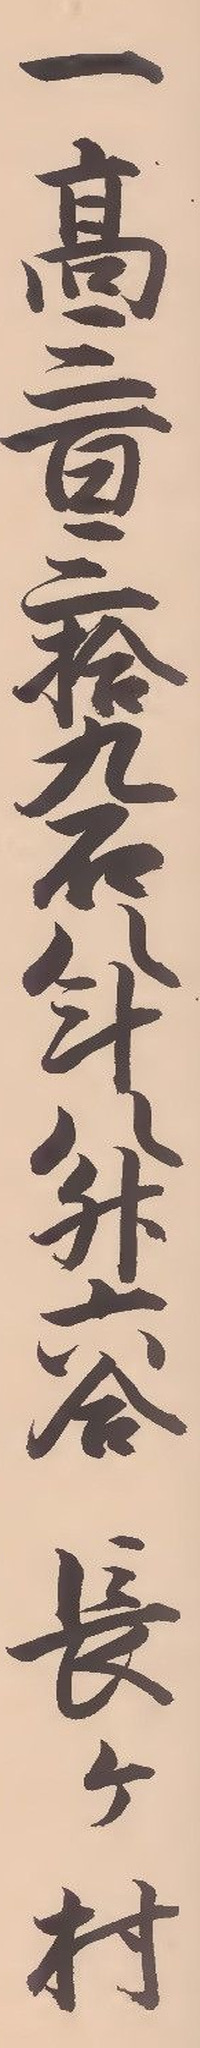一高三百三拾九石八斗八升六合長ケ村
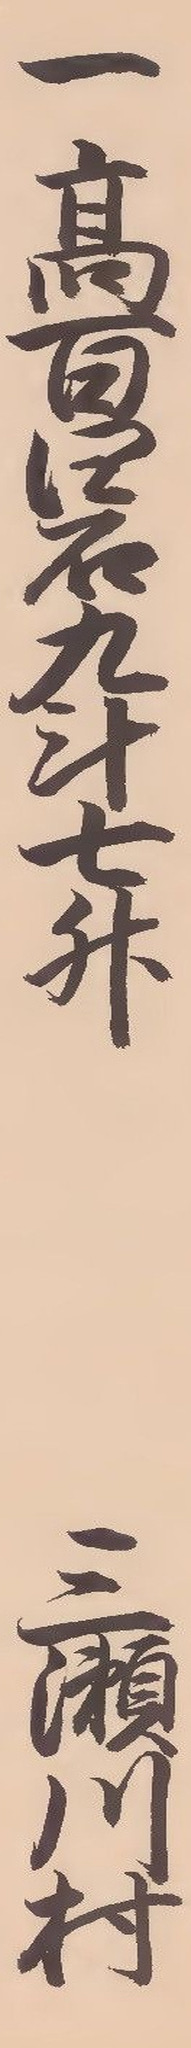一高百四石九斗七升三瀬川村
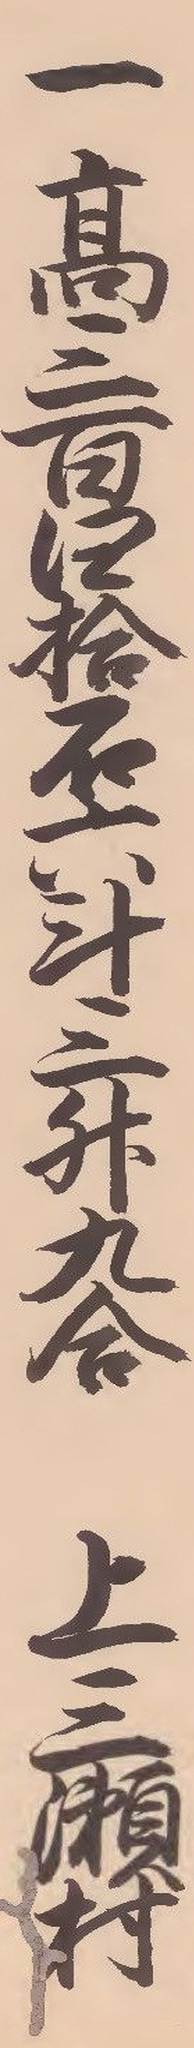一高三百四拾石六斗三升九合上三瀬村
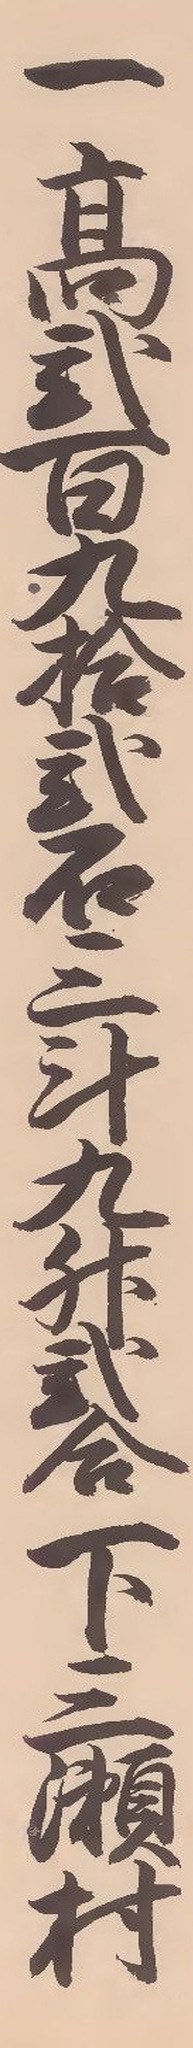一高弐百九拾弐石三斗九升弐合下三瀬村

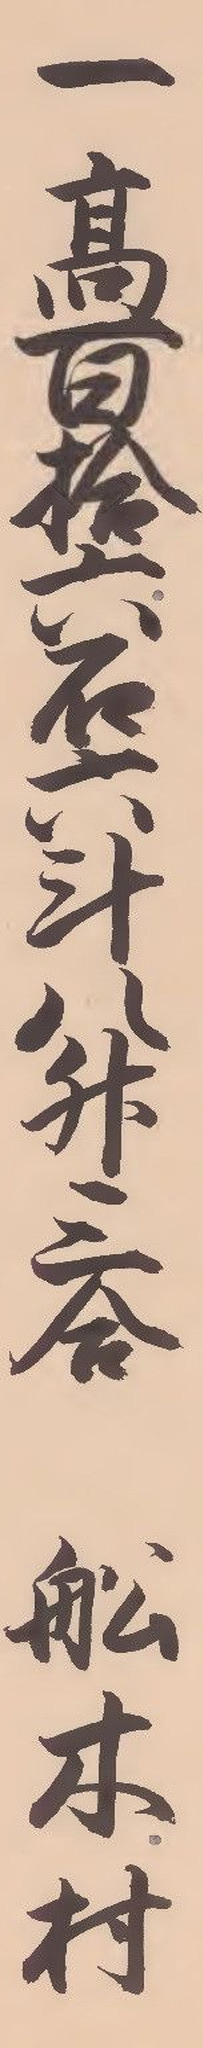一高百拾六石六斗八升三合船木村
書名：伊勢国郷帳
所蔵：国立公文書館 National Archives of Japan
